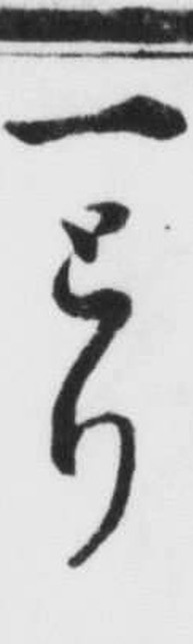一とり
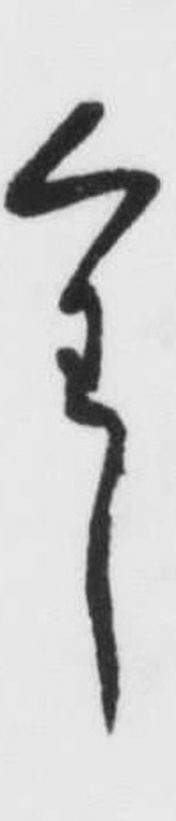くわし
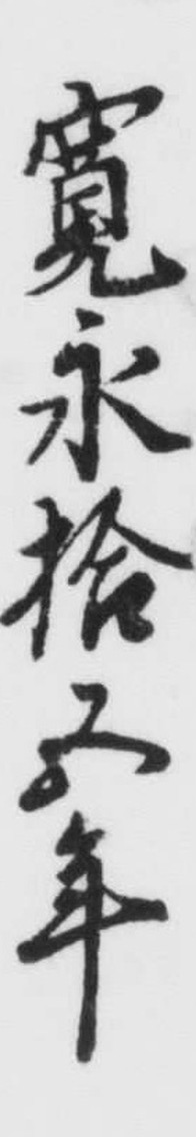寛永拾五年
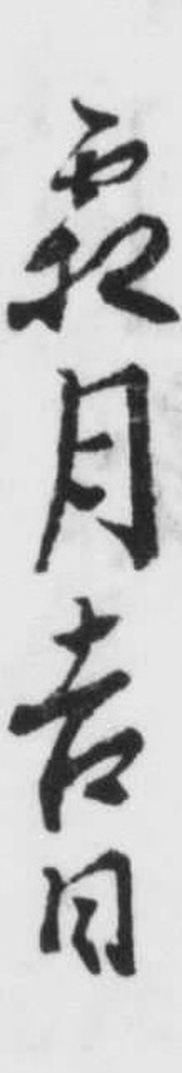霜月吉日

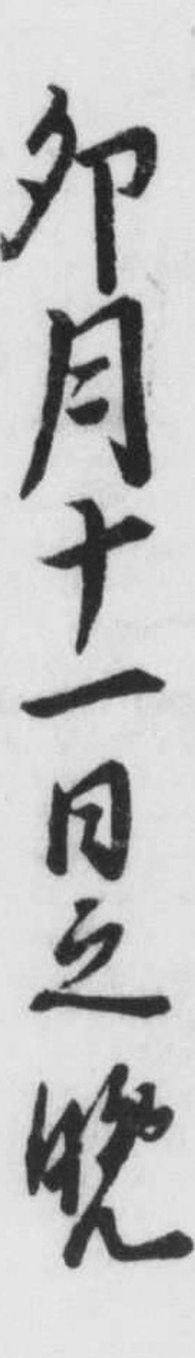夘月十一日之晩
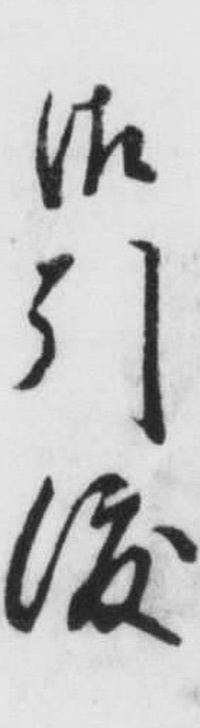御引渡
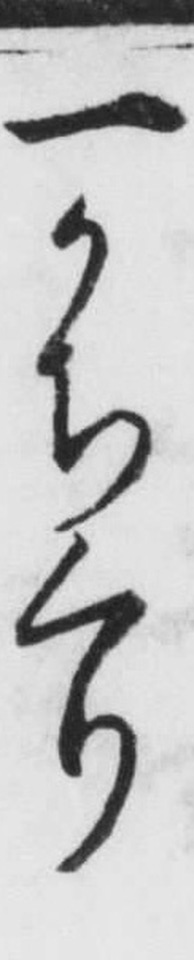一かちくり
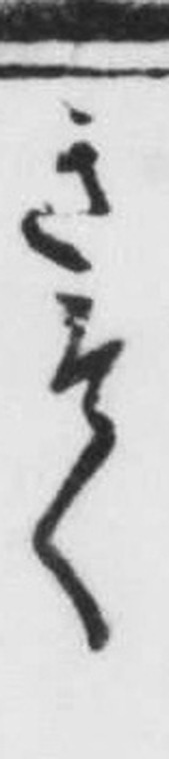きそく
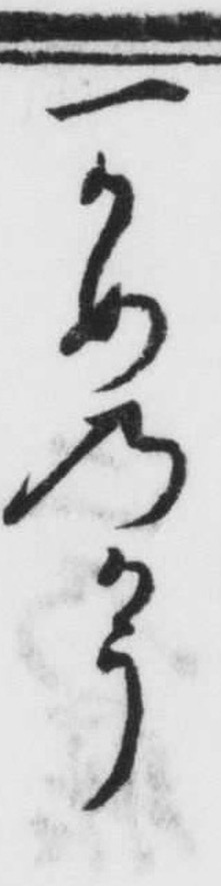一かめのかう
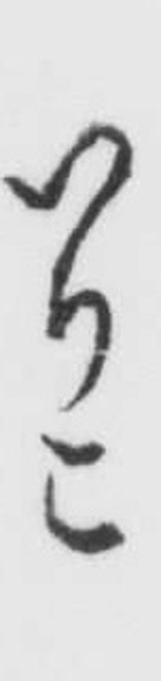いりこ
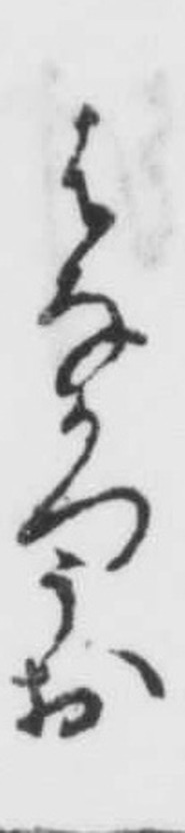はなかつうを
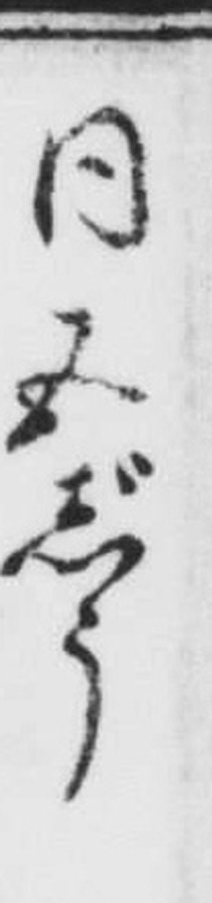同又じう
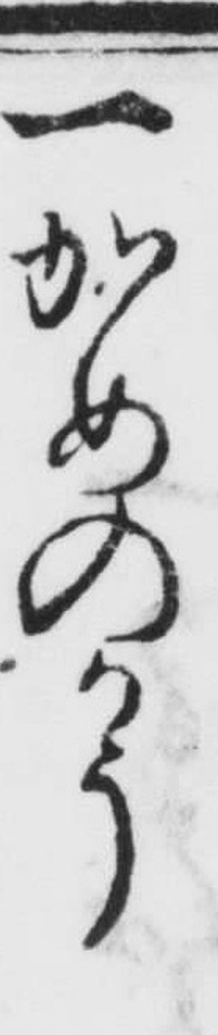一かめのかう
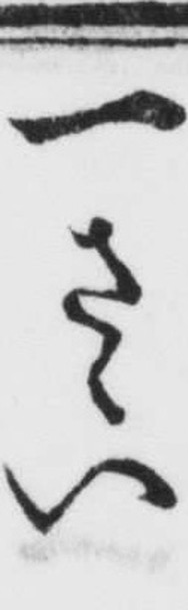一さゝい
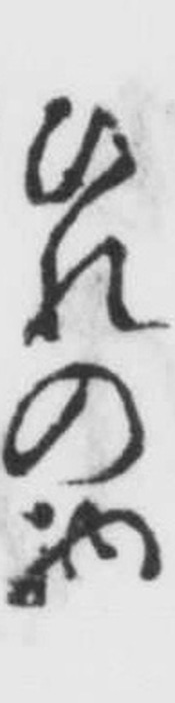ひれの物
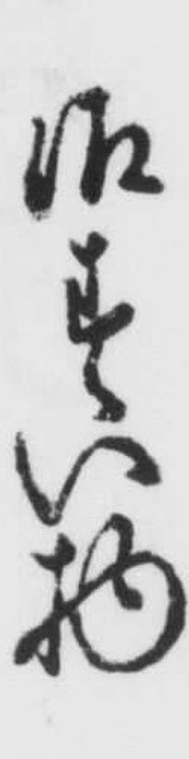酒すい物
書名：料理切形秘伝抄
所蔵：大阪府立大学学術情報センター 国文学研究資料館
